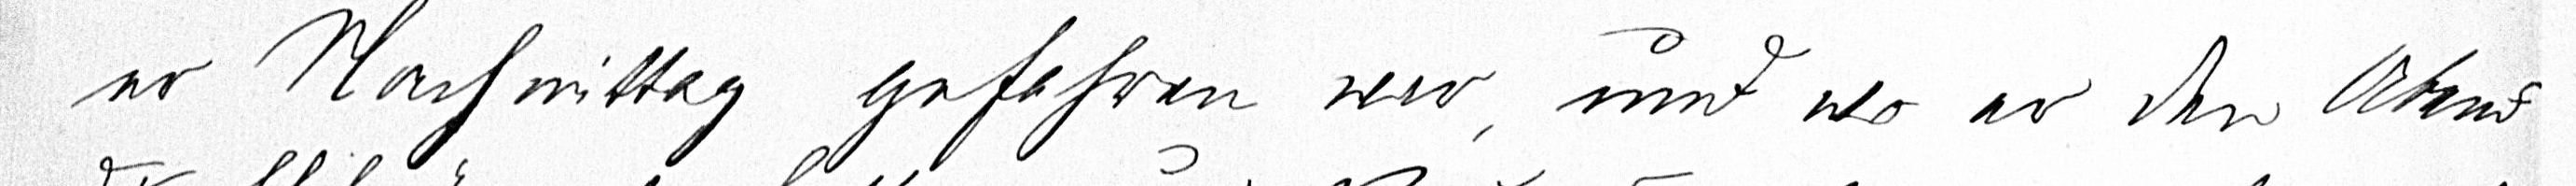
er Nachmittag gefahren war, und wo er den Abend
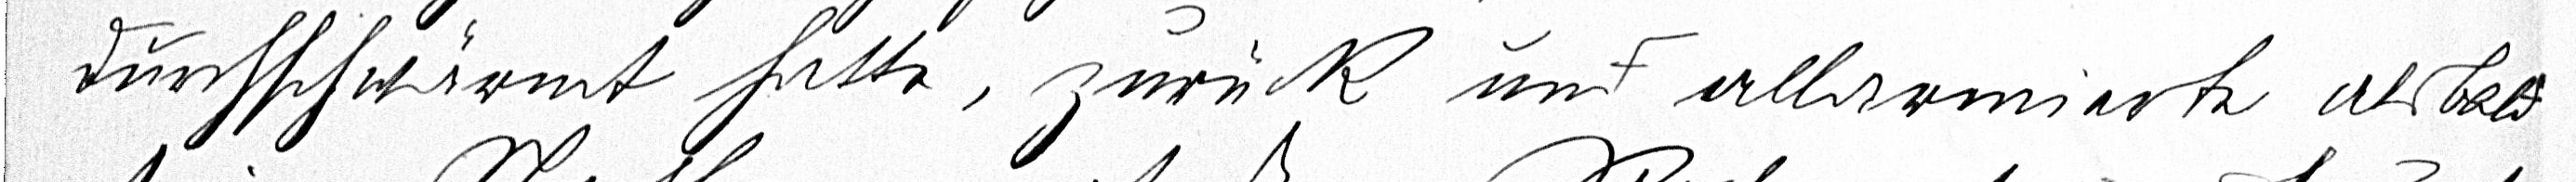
durchschwärmt hatte, zurück und allxxmierte alsxx
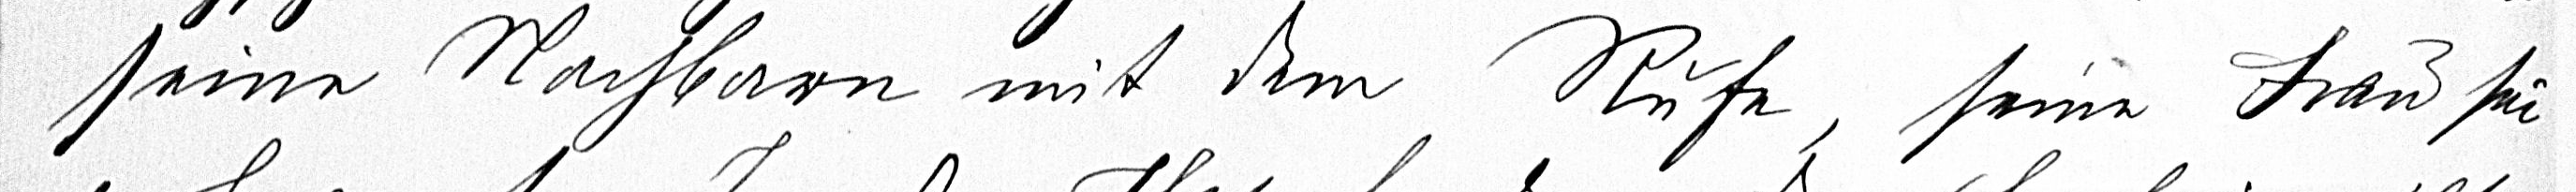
seine Nachbarn mit dem Rufe, seine Frau sei
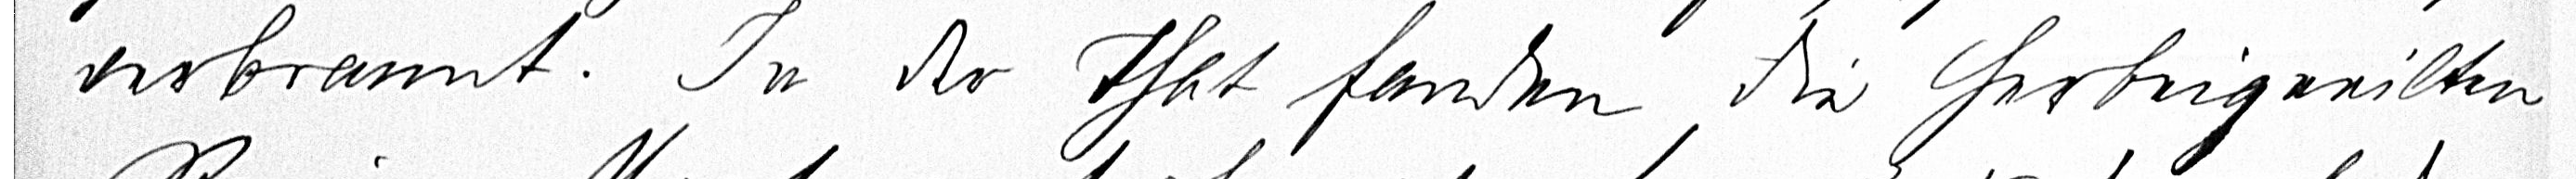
verbrannt. In der That fanden die Herbeigeeilten
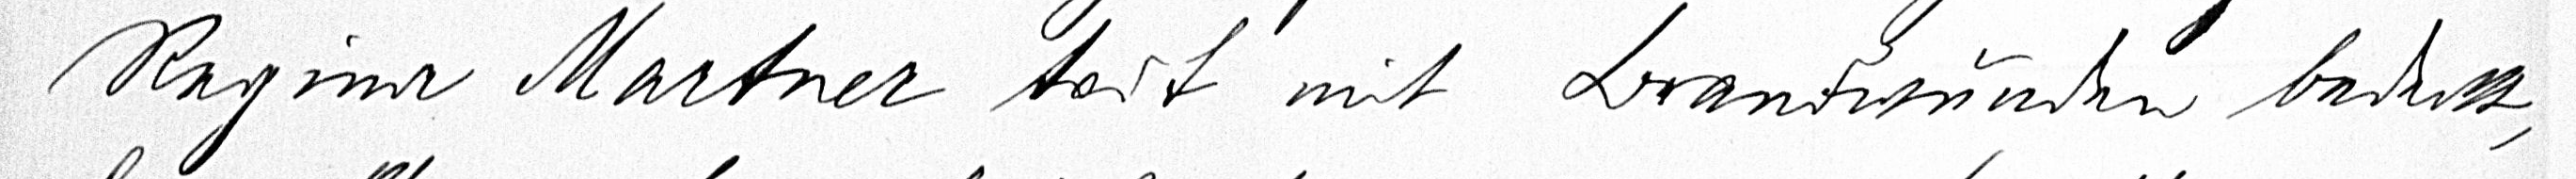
Regina Martner todt mit Brandwunden bedeckt,
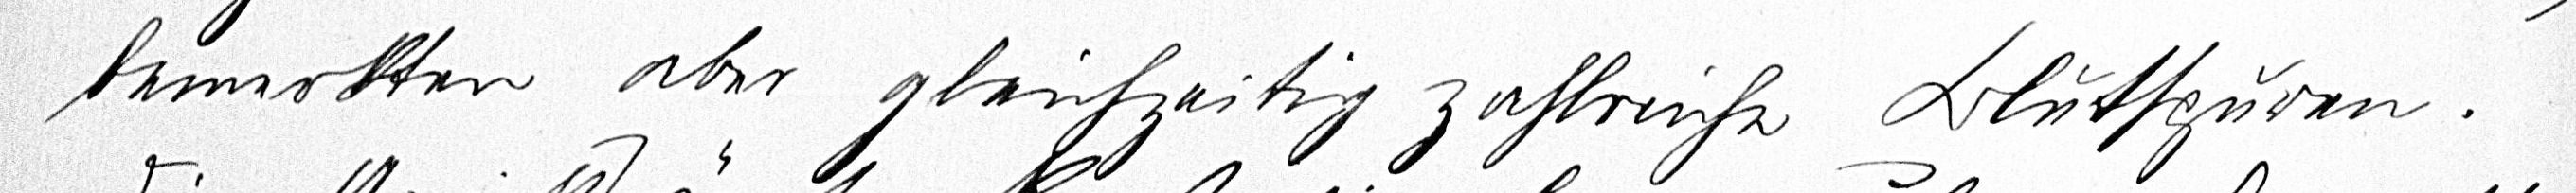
bemerkten aber gleichzeitig zahlxx Blutspuren.
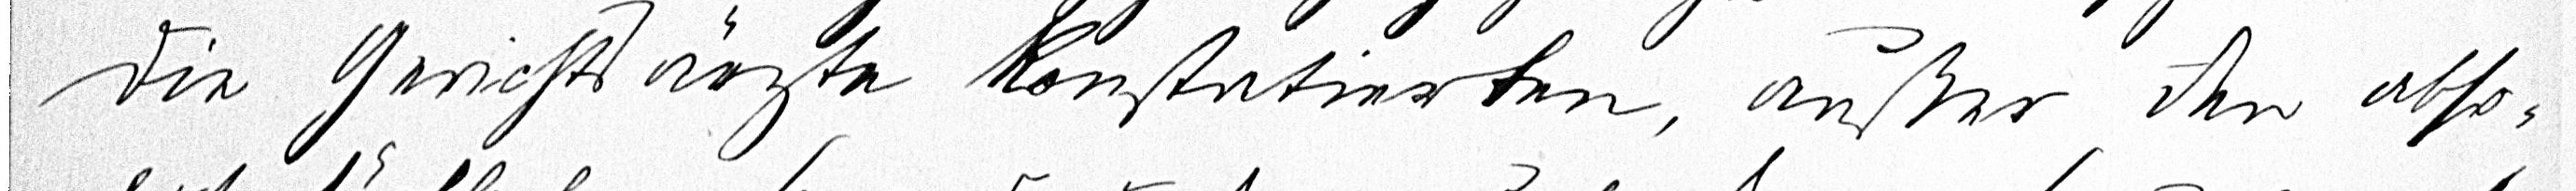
Die Gerichtsärzte konstatierten, außer den abso¬
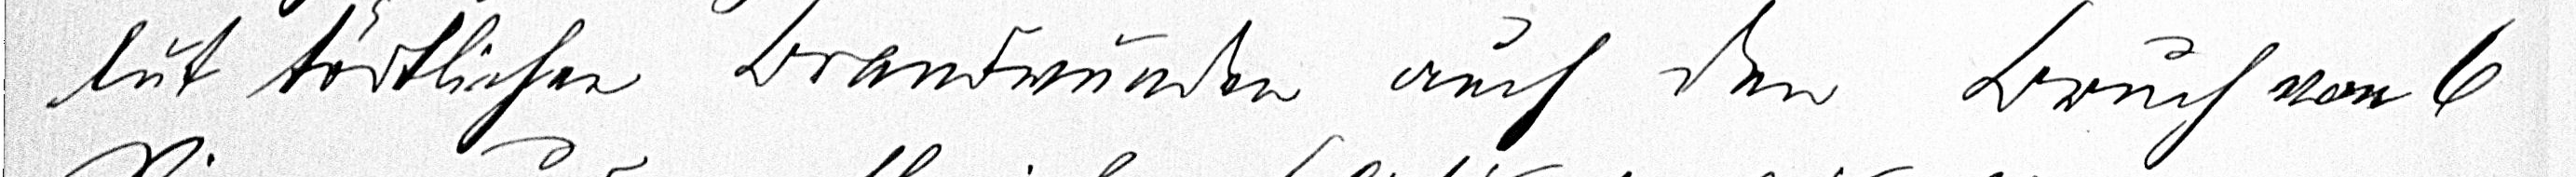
lut tödtlichen Brandwunden auch den Bruch von 6
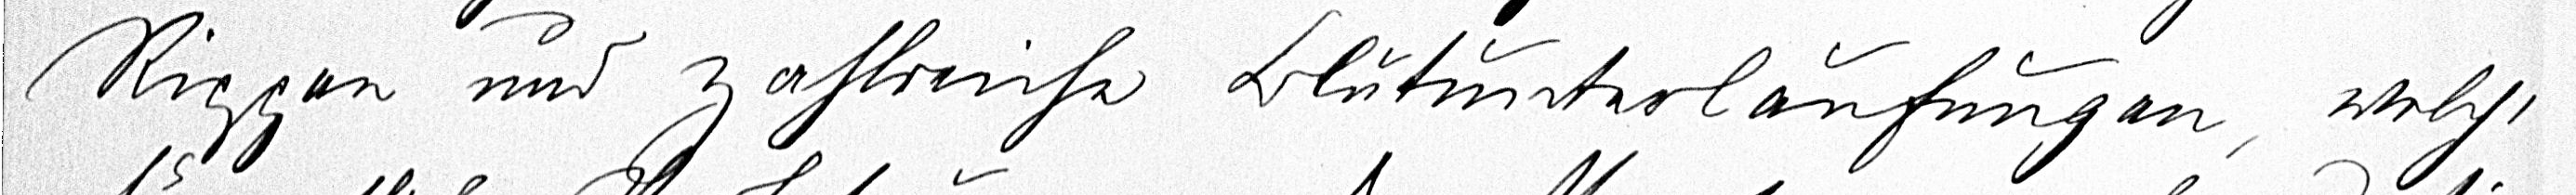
Rippen und zahlreiche Blutunterlaufungen, welch'
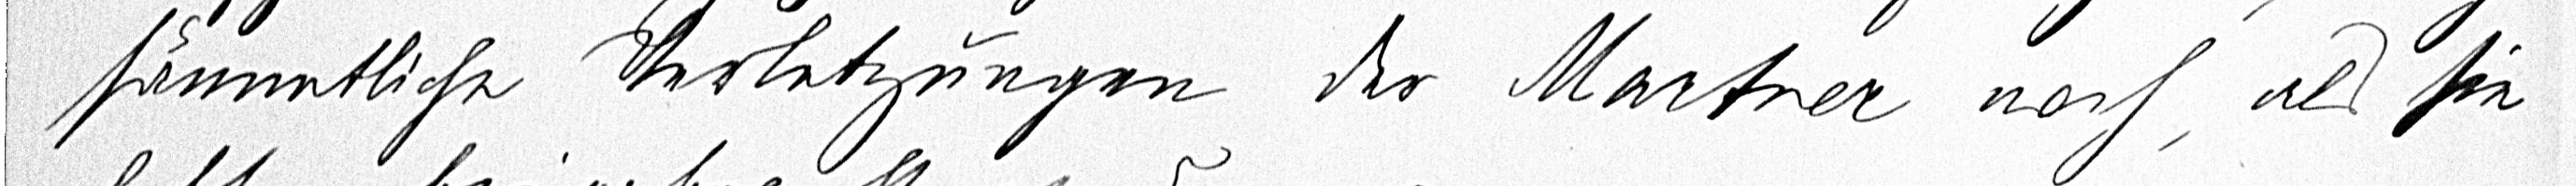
sännetliche Verletzungen der Martner noch, als sie
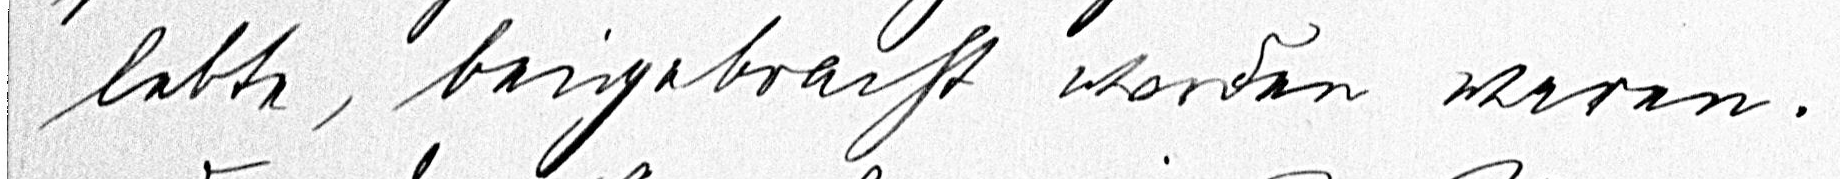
lebte, beigebracht worden waren.
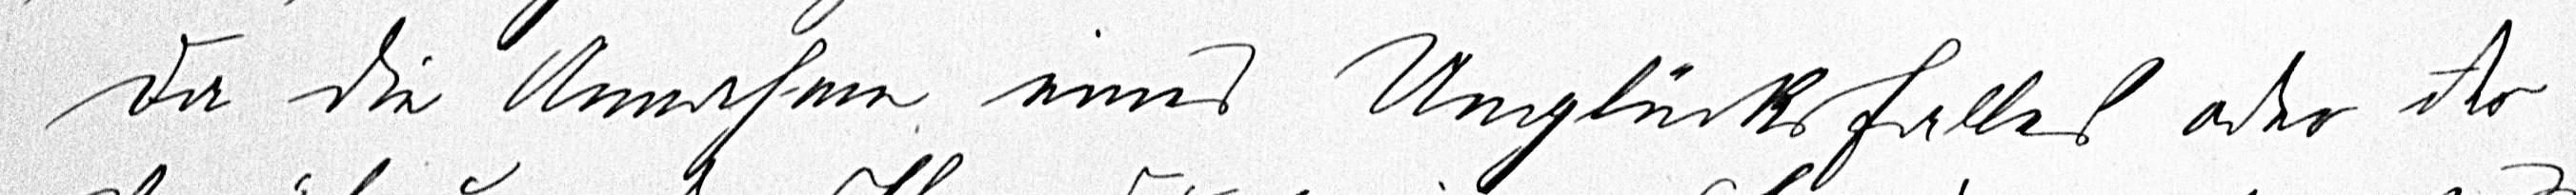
Da die Unnahme eines Unglücksfalles oder der
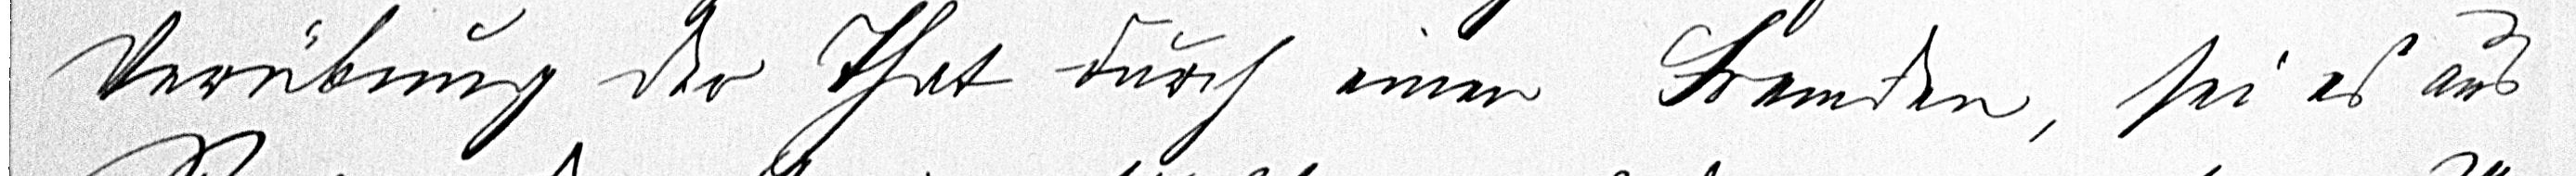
Verübung der That durch einen Fremden, sei es aus
